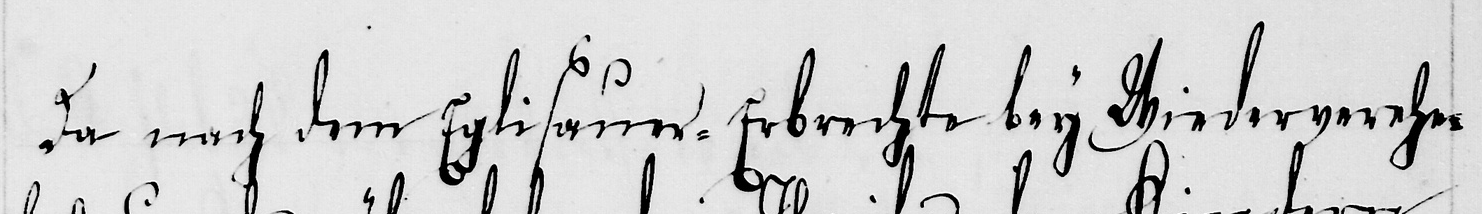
Da nach dem Eglisauer-Erbrechte bey Wiederverehe¬
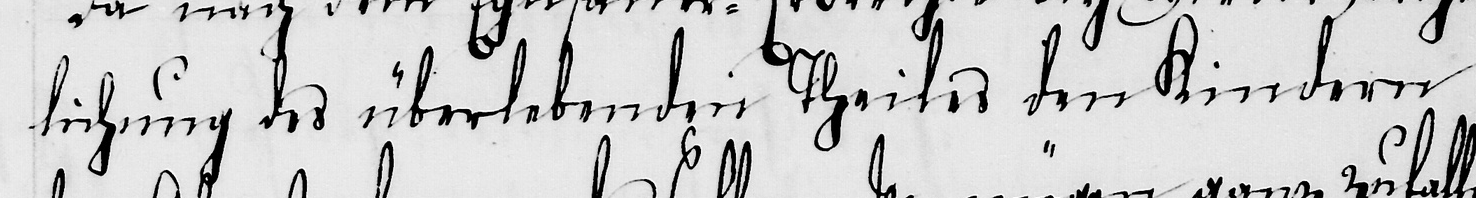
lichung des überlebenden Theiles den Kindern
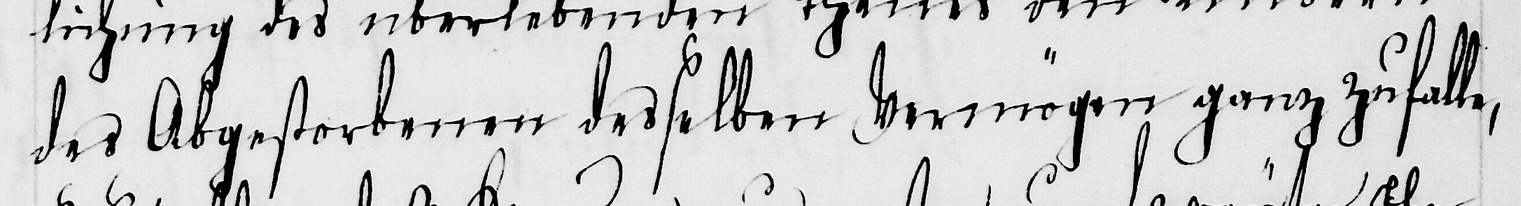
des Abgestorbenen desselben Vermögen ganz zufalle,
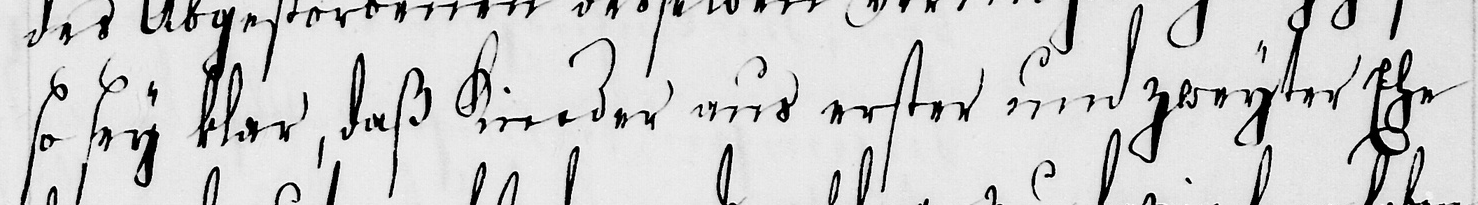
so sey klar, daß Kinder aus erster und zweyter Ehe
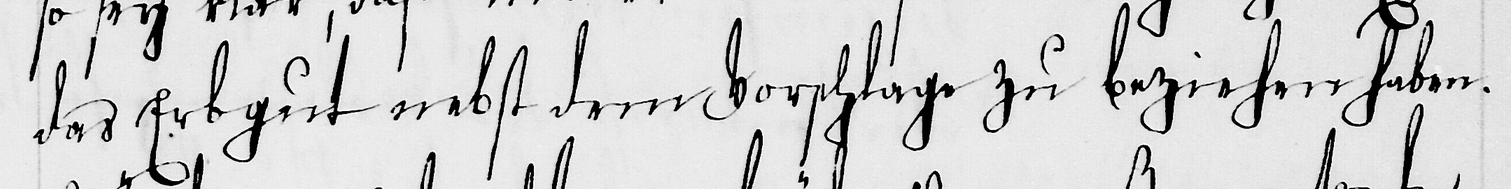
das Erbgut nebst dem Vorschlage zu beziehen haben.
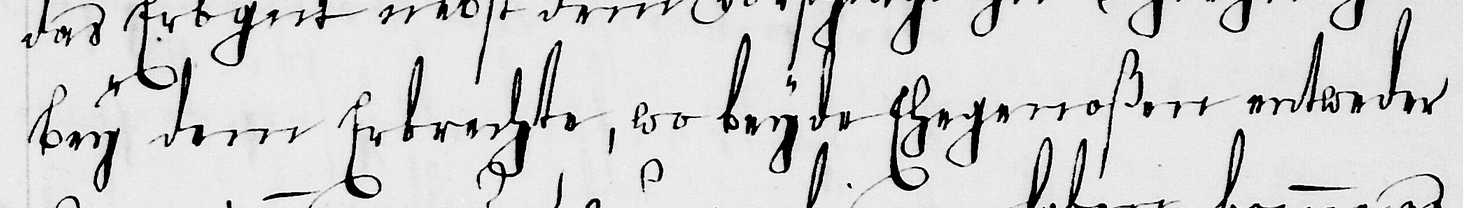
Bey dem Erbrechte, wo beyde Ehegenoßen entweder
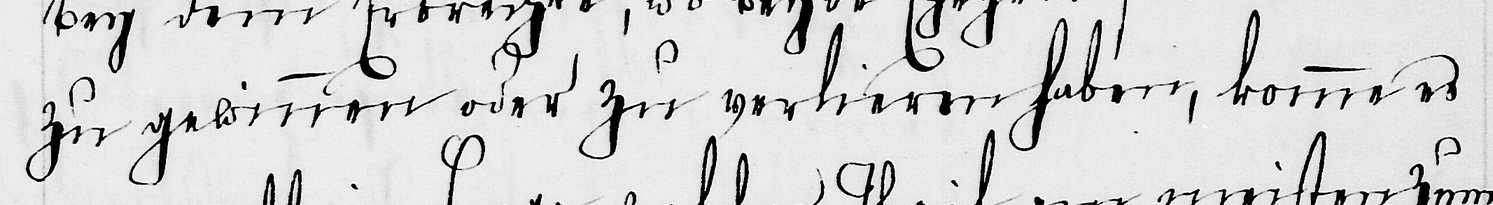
zu gewinnen oder zu verlieren haben, komme es
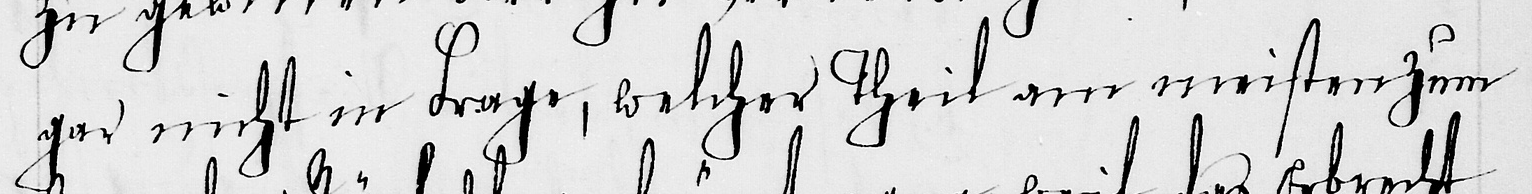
gar nicht in Frage, welcher Theil am meisten zum
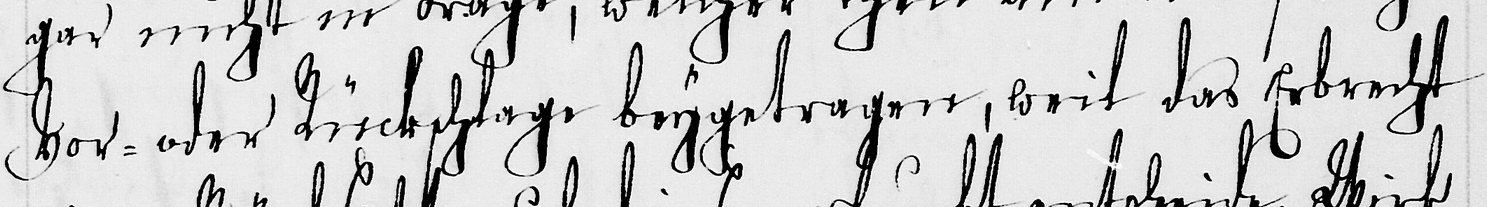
Vor- oder Rückschlage beygetragen, weil das Erbrecht
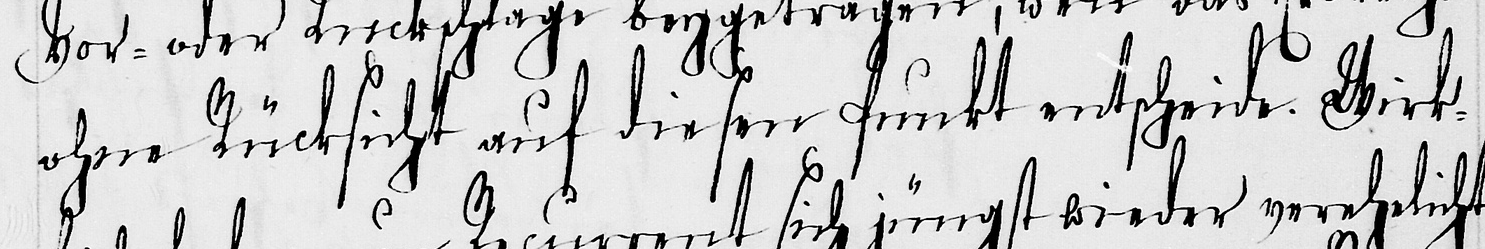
ohne Rücksicht auf diesen Punkt entscheide. Wirk¬
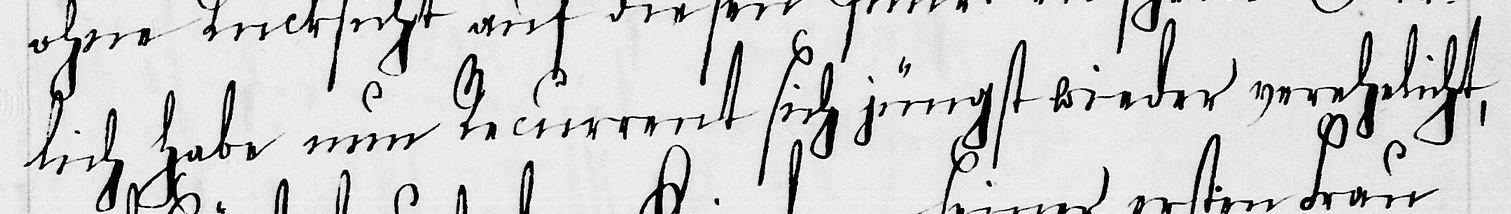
lich habe nun Recurrent sich jüngst wieder verehelicht,
